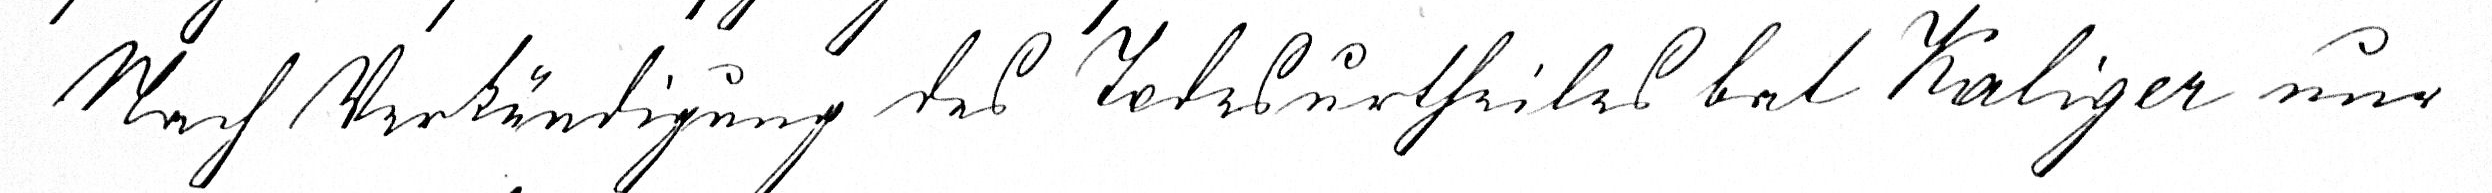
Nach Verkündigung des Todesurtheiles bat Kaliger nur
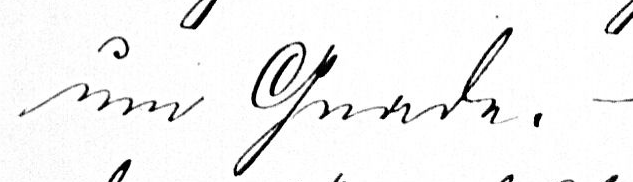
um Gnade.-
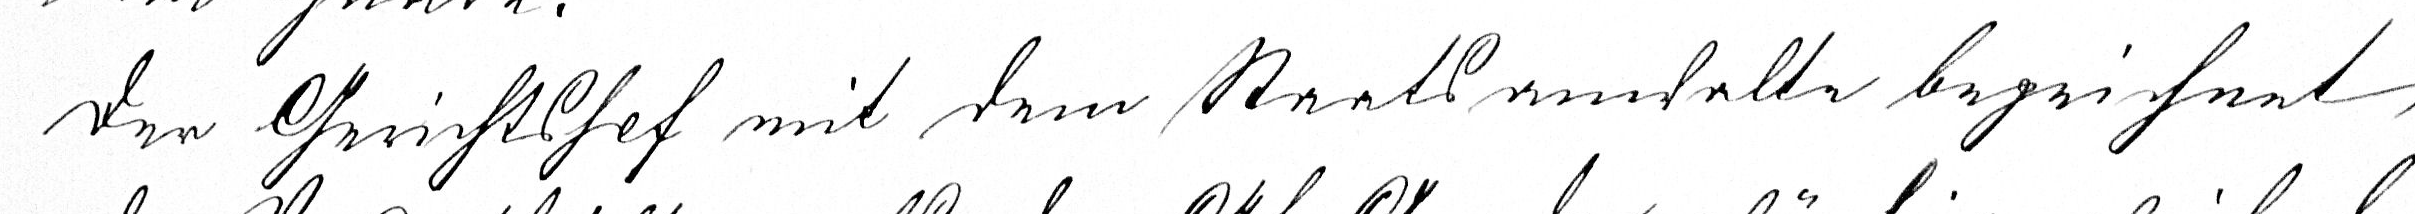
Der Gerichtshof mit dem Staatsanwalte bezeichnet
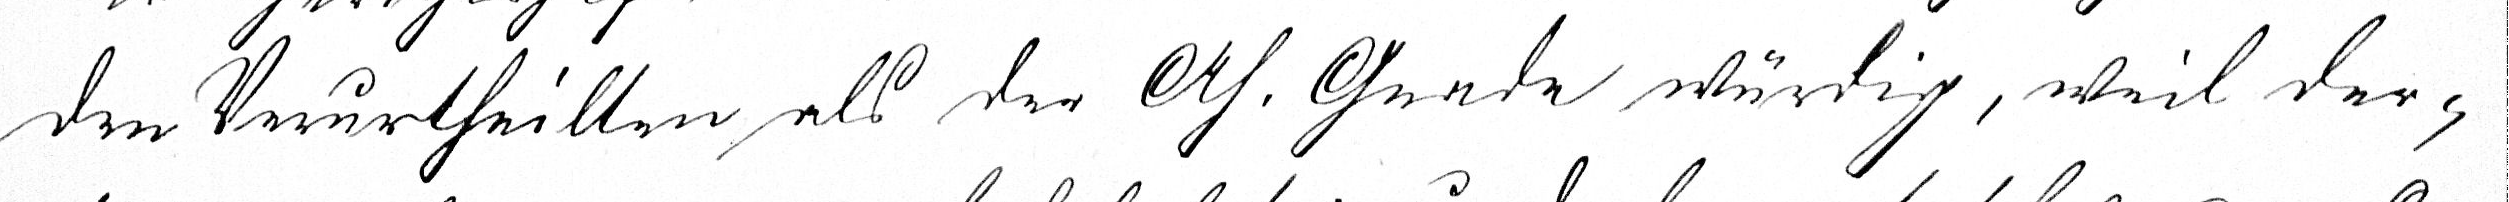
den Verurtheilten als der Ah. Gnade würdig, weil der¬
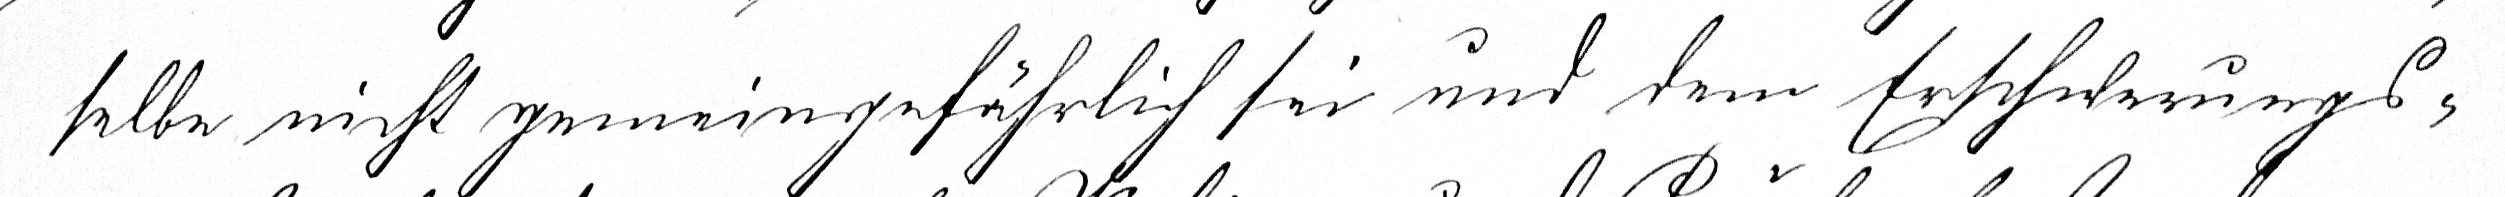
selbe nicht gemeingefährlich sei und dem Erschwerungs¬
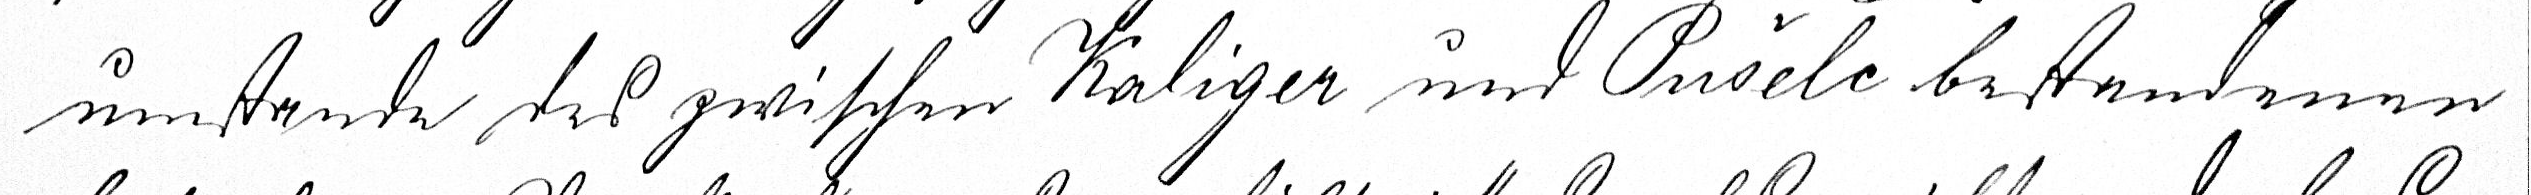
umstande des zwischen Kaliger und Pušelc bestandenen
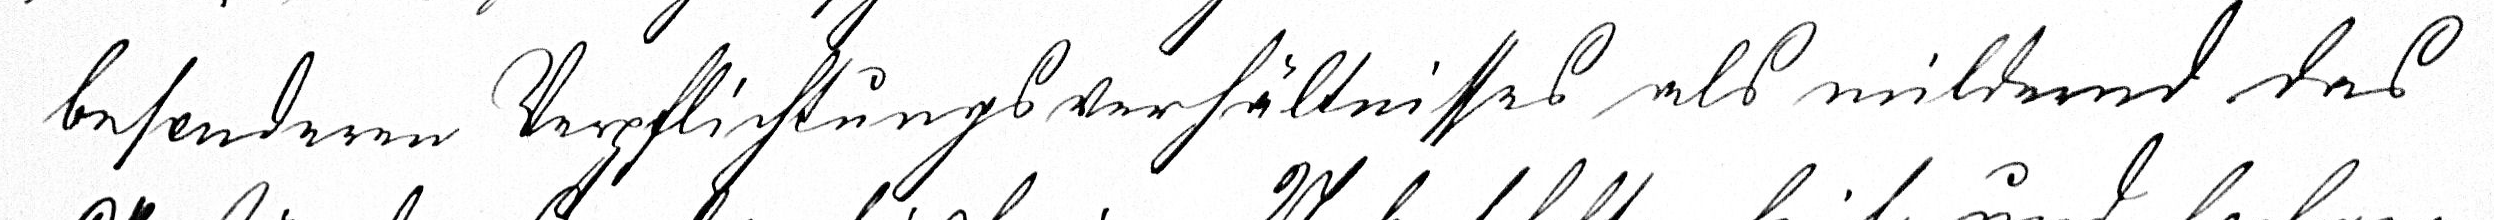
besonderen Verpflichtungsverhältnisses als mildernd das
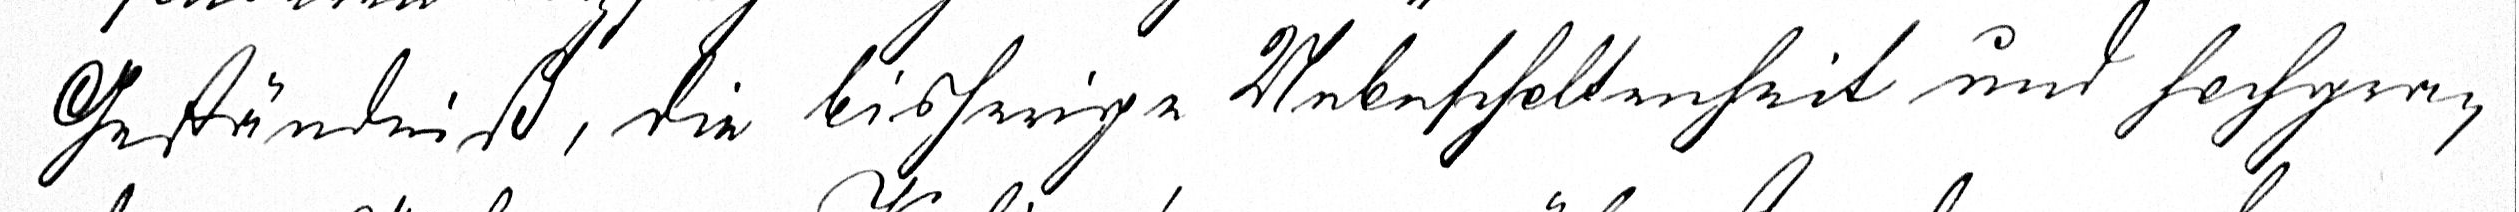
Geständniß, die bisherige Unbescholtenheit und hochgra¬
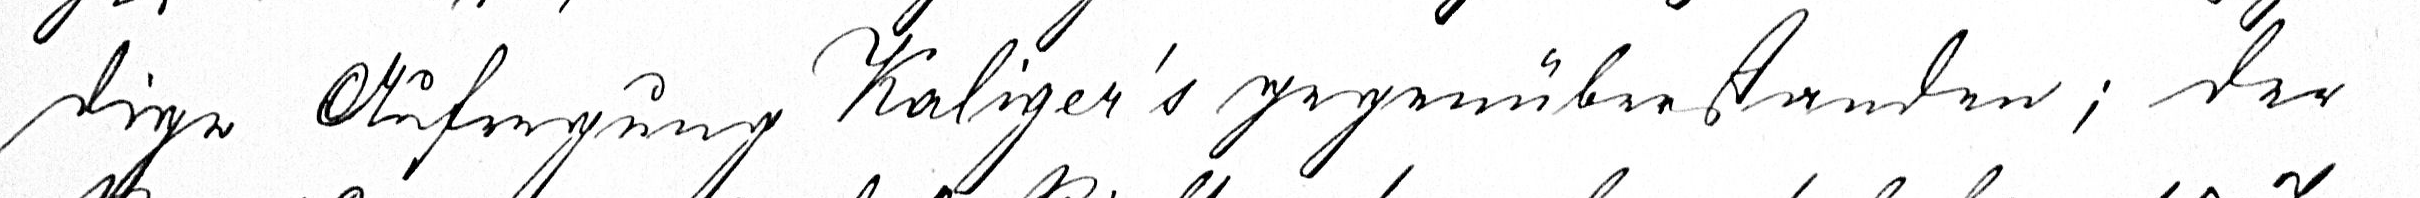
dige Aufregung Kaliger’s gegenüberstanden; der
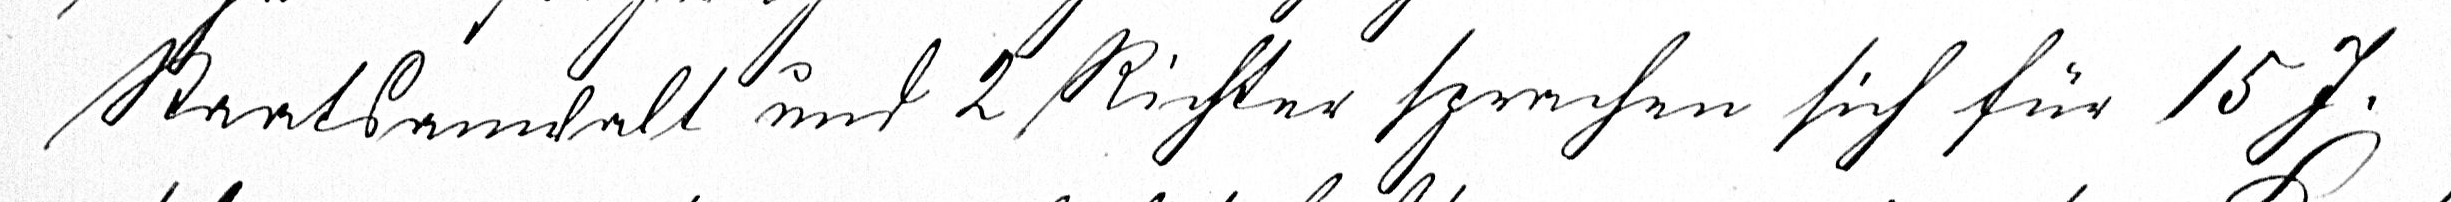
Staatsanwalt und 2 Richter sprachen sich für 15 J.
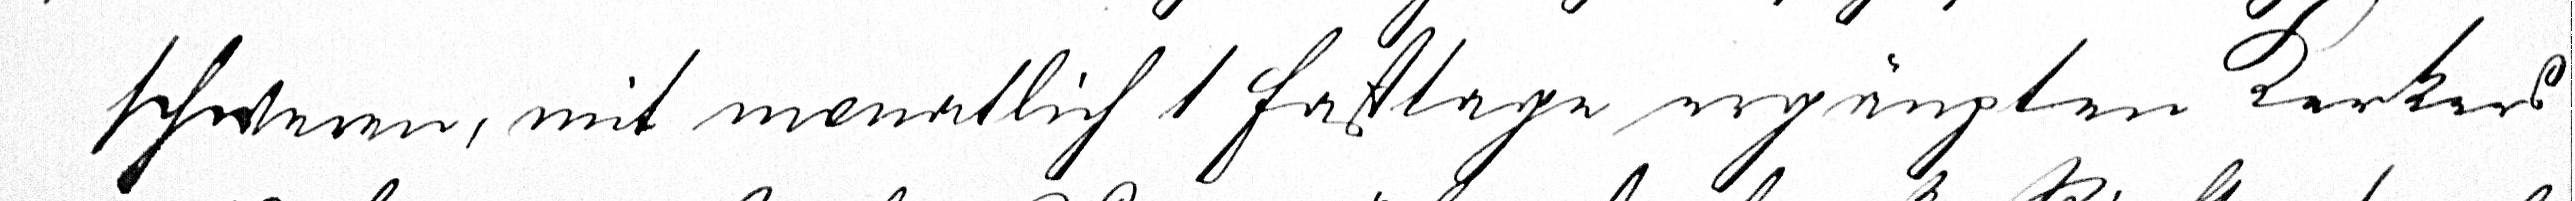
schweren, mit monatlich 1 Fasttage ergänzten Kerkers
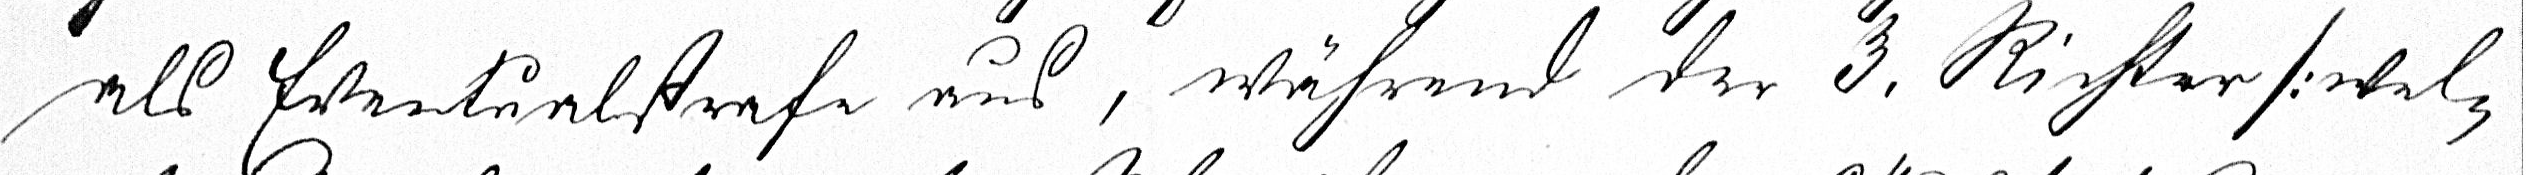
als Eventualstrafe aus, während der xx. Richter /:wel¬
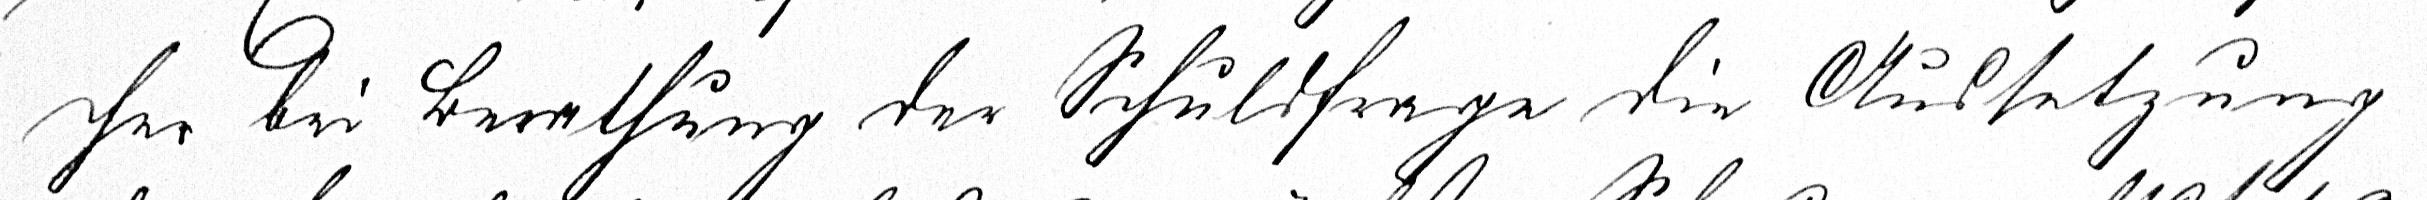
cher bei Berathung der Schuldfrage die Aussetzung
